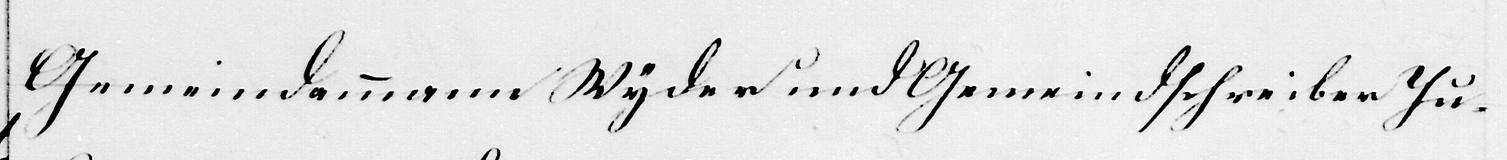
Gemeindammann Wyder und Gemeindschreiber Ju¬
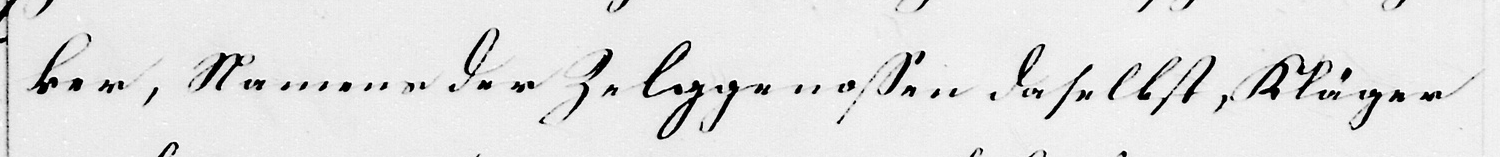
ker, Namens der Zelggenoßen daselbst, Kläger
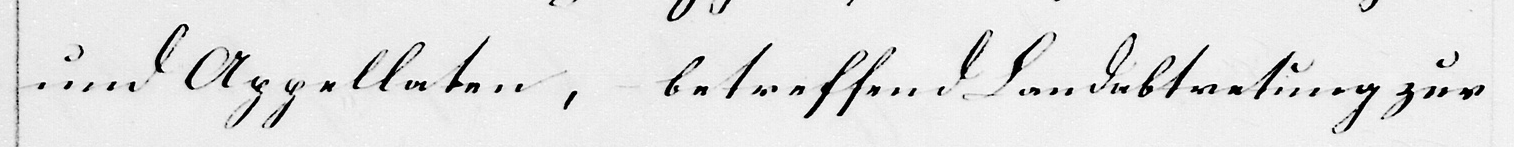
und Appellaten, betreffend Landabtretung zur
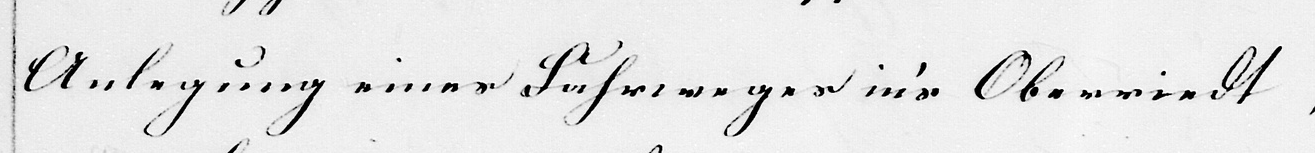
Anlegung eines Fahrweges in’s Oberriedt,
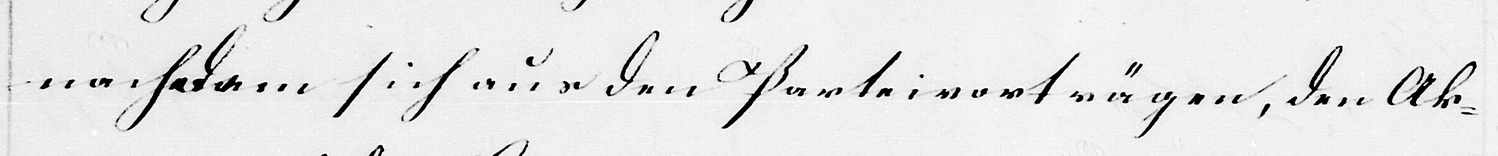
nachdem sich aus den Parteivorträgen, den Ak¬
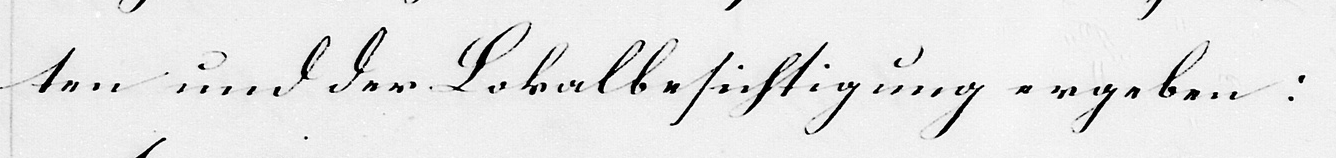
ten und der Lokalbesichtigung ergeben:
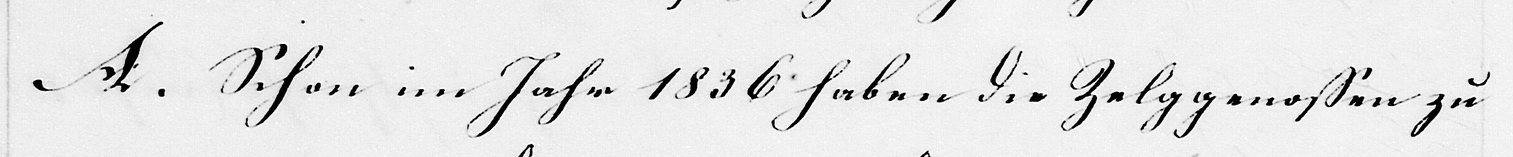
A. Schon im Jahr 1836 haben die Zelggenoßen zu
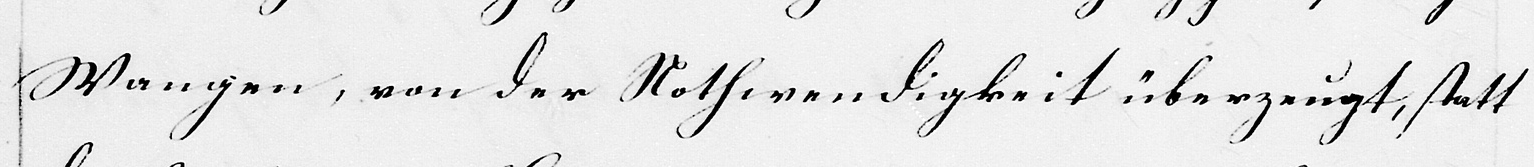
Wangen, von der Nothwendigkeit überzeugt, statt
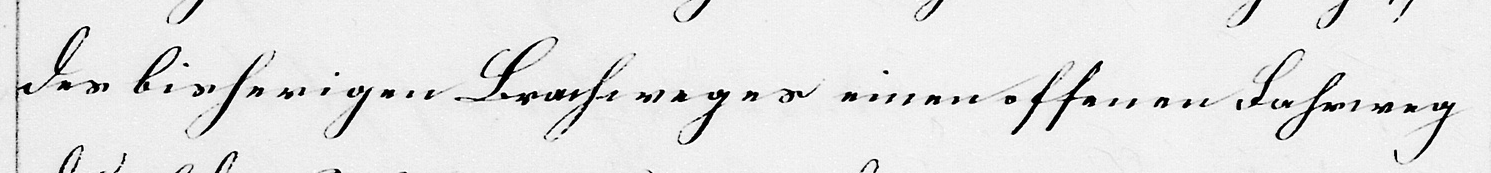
des bisherigen Brachweges einen offenen Fahrweg
